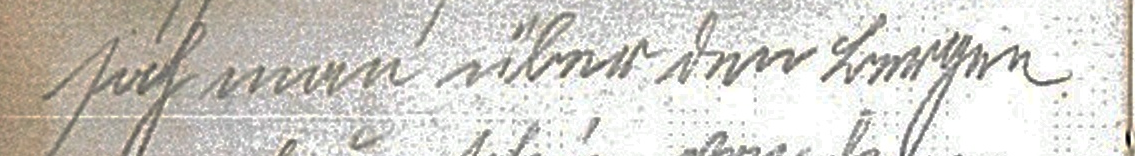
sah man über den Bergen
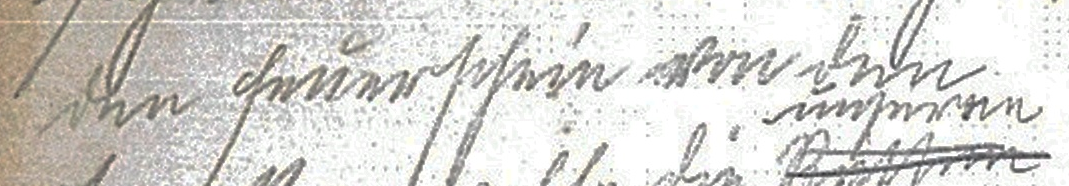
den Feuerschein von den
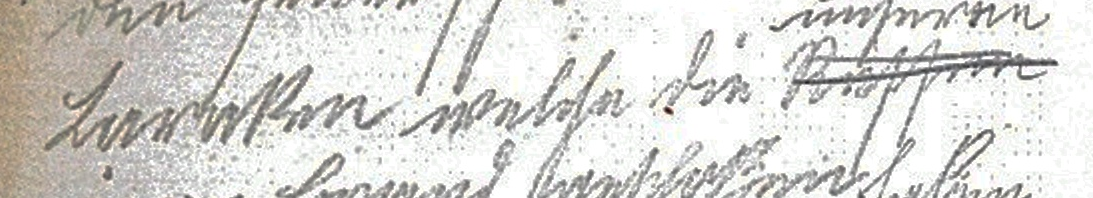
Baracken welche die unseren
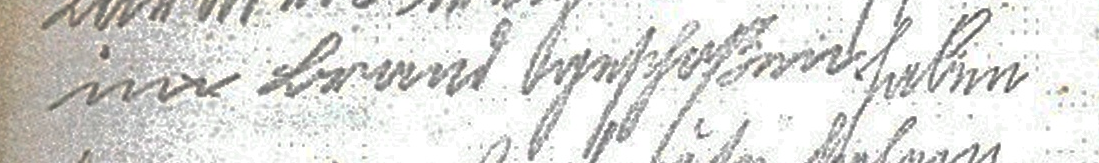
in Brand geschossen haben.
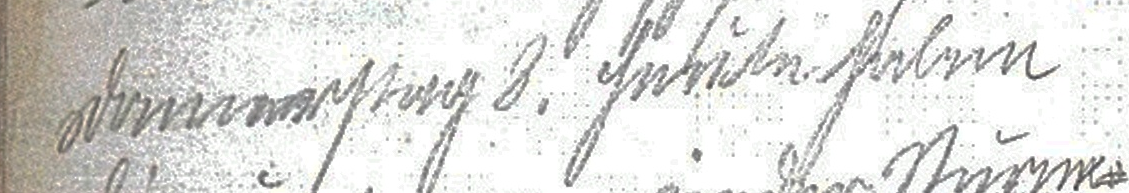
Donnerstag 8. heute haben
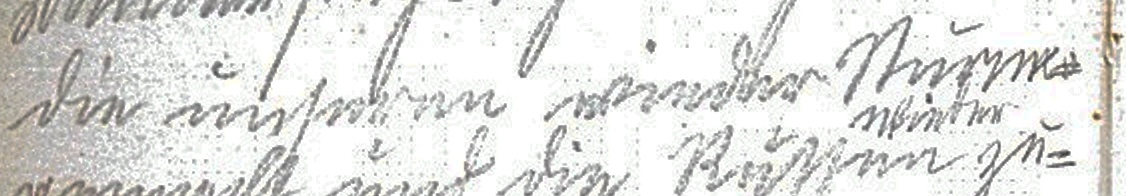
die unseren wieder Sturm
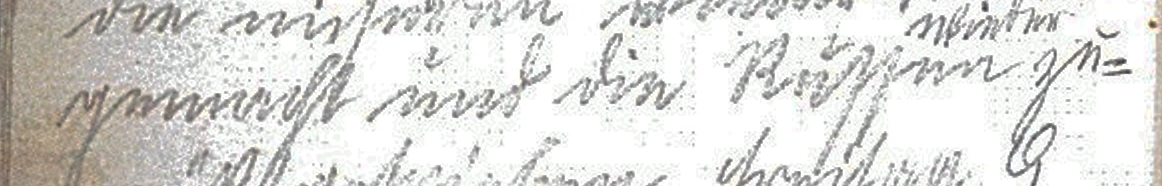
gemacht und die Russen wieder zu=
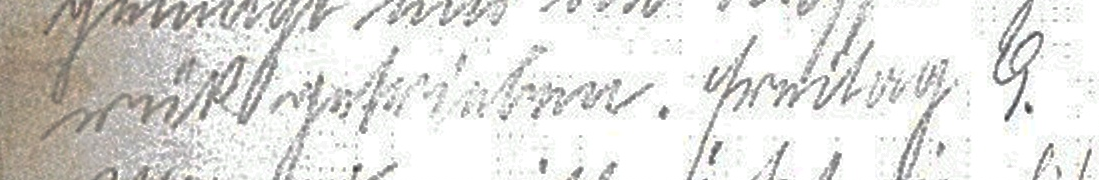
rück getrieben. Freitag 9.
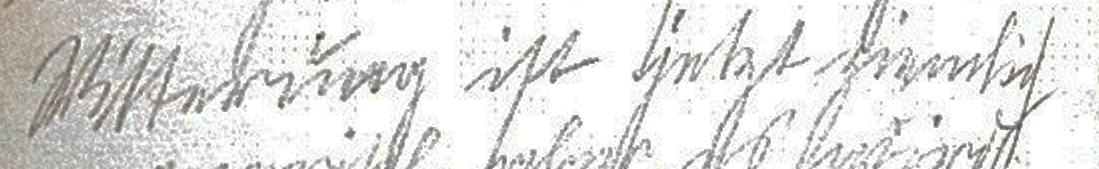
witterung ist jetzt ziemlich
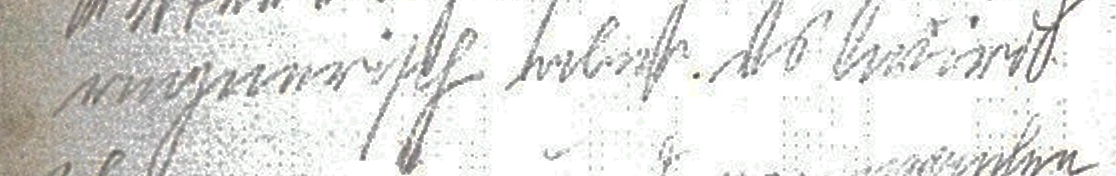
regnerisch aber es wird
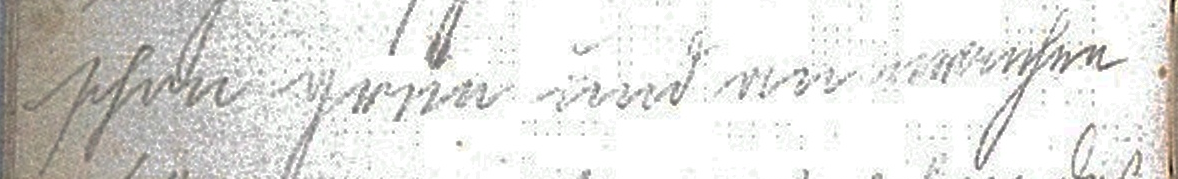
schon grün und an manchen
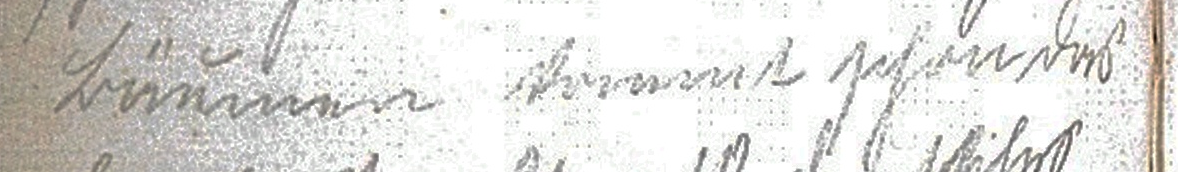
Bäumen kommt schon das
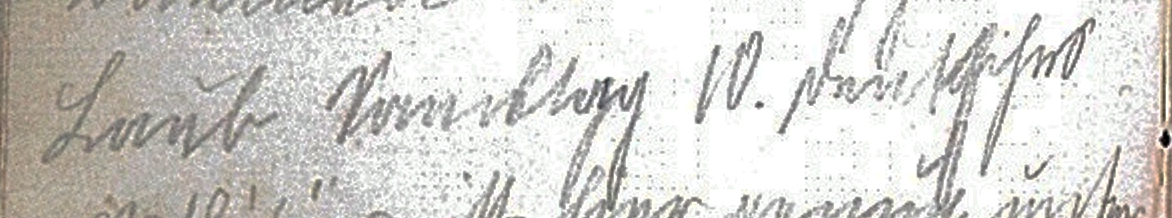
Laub Sonntag 10. deutsches
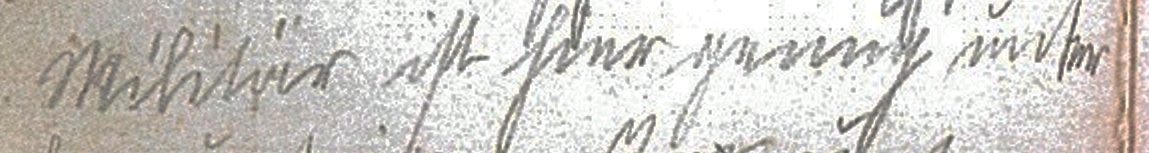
Militär ist hier genug unter
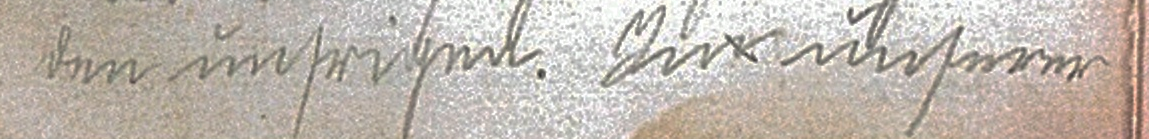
den unsrigen.In unserer
